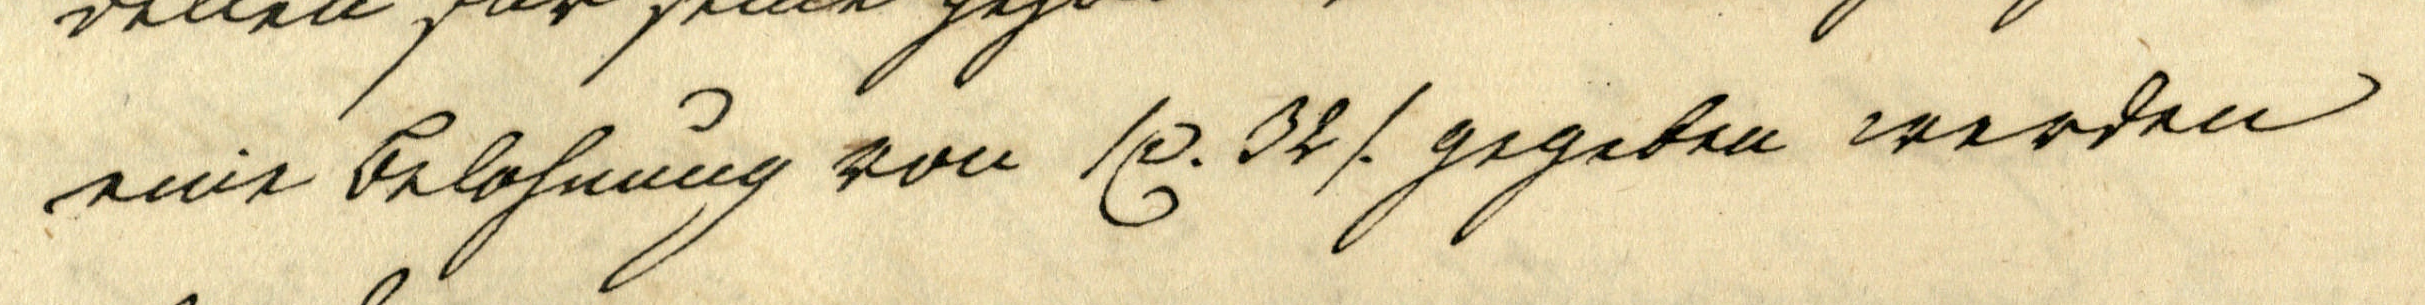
eine Belohnung von 1 l. 32 s. gegeben werden
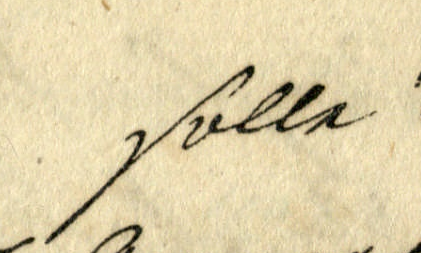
solle?
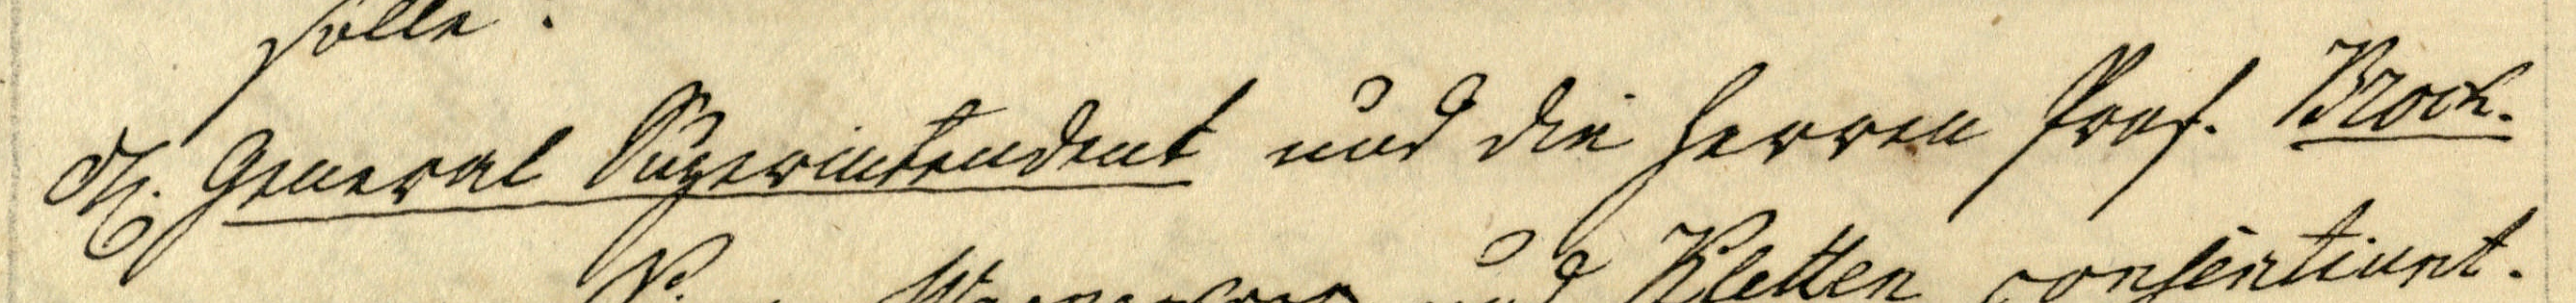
dh. General Superintendent und die Herren Prof. Brock¬
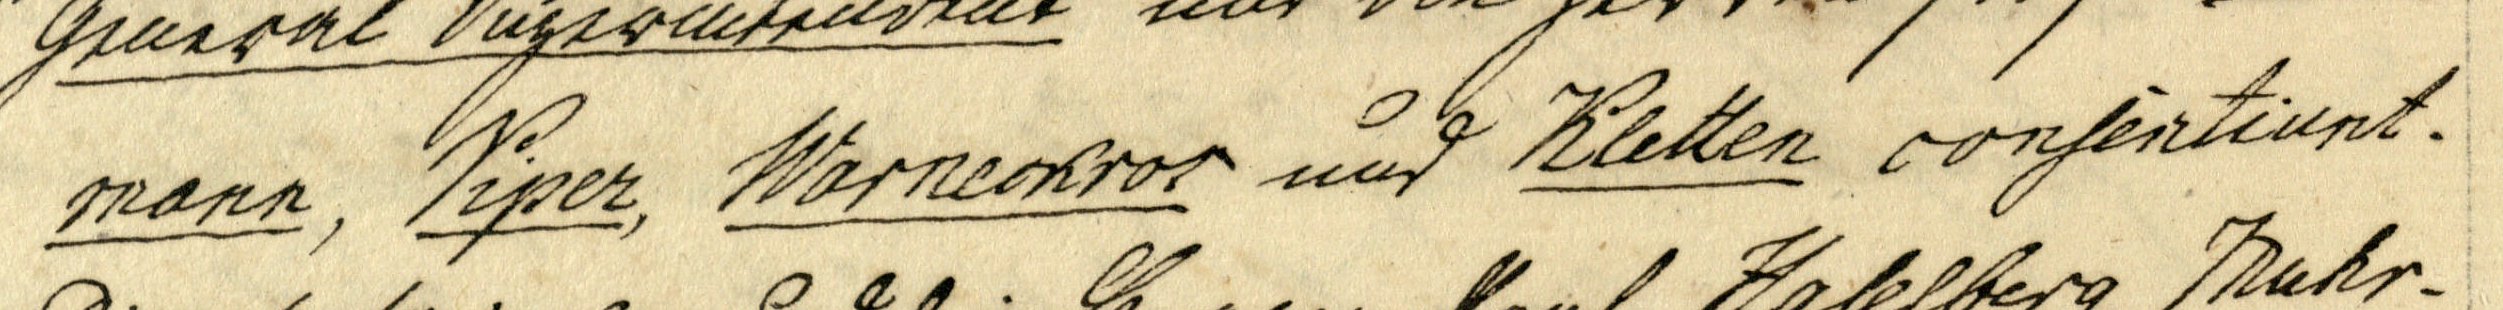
mann, Piper, Warneckros und Kletten consentiunt.
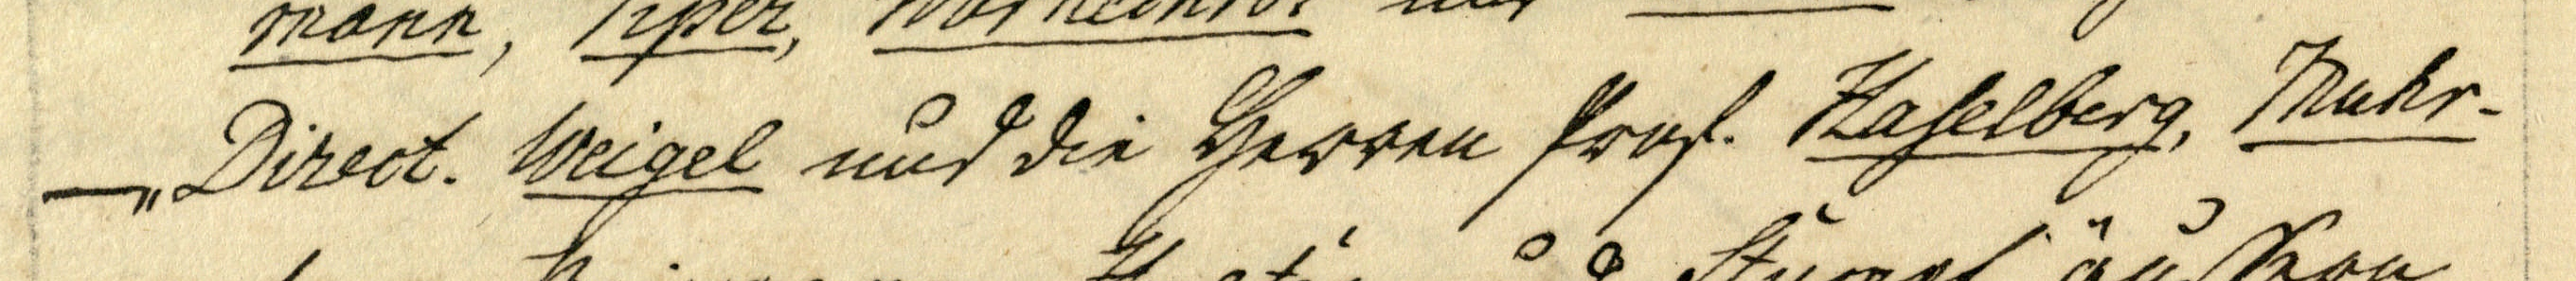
Direct. Weigel und die Herren Prof. Haselberg, Muhr¬
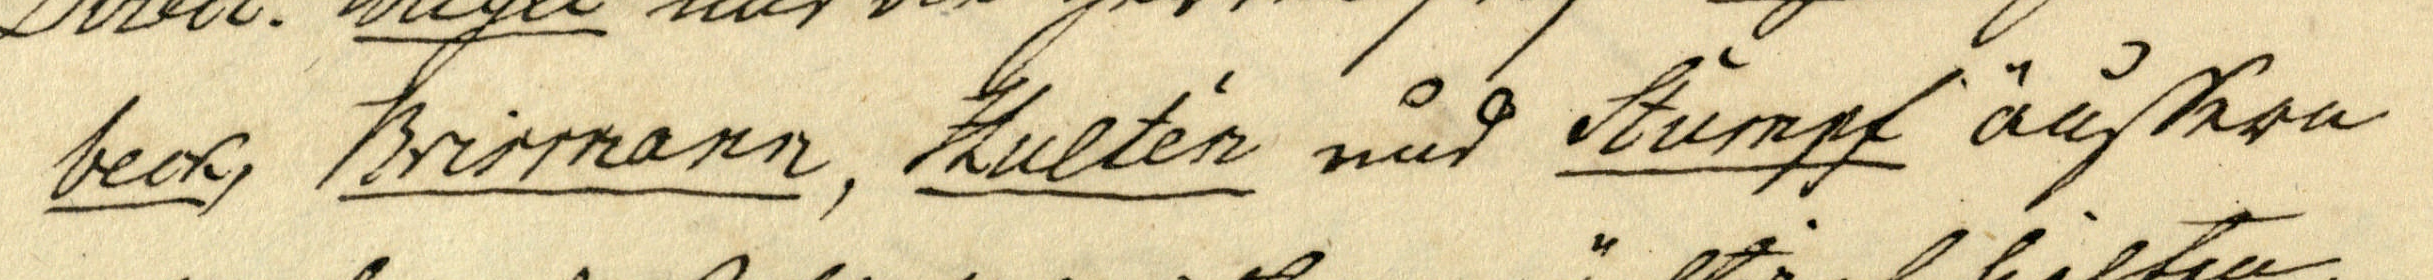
beck, Brismann, Hultén und Stumpf äussern
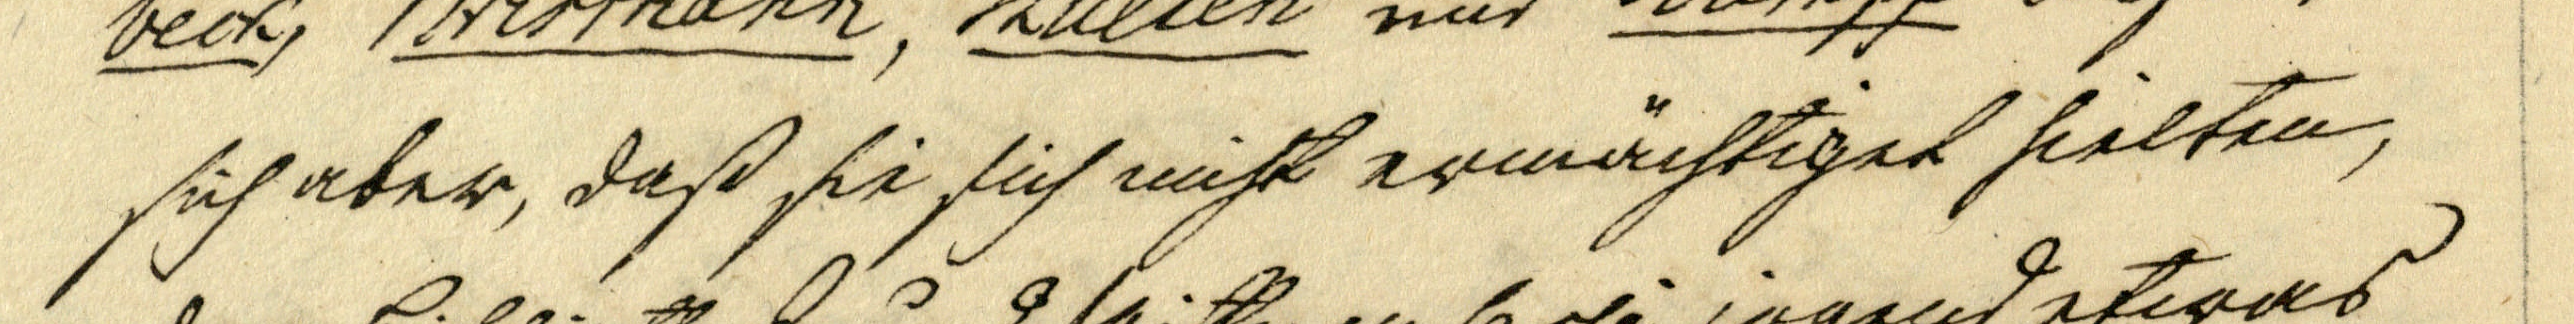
sich aber, daß sie sich nicht ermächtiget hielten,
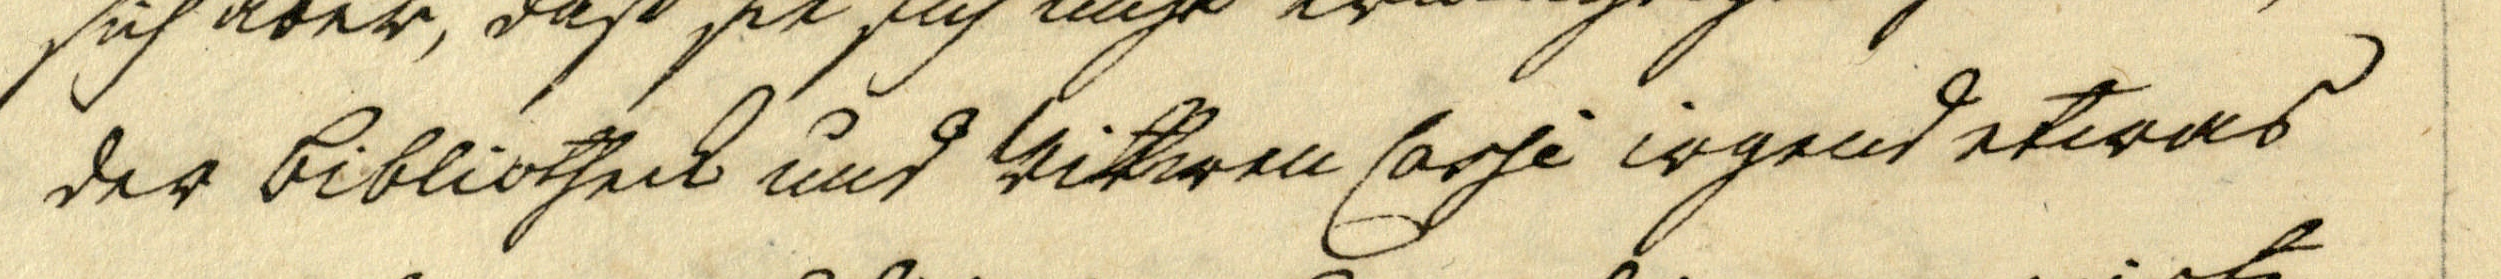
der Bibliotheck und Wittwen Casse irgend etwas
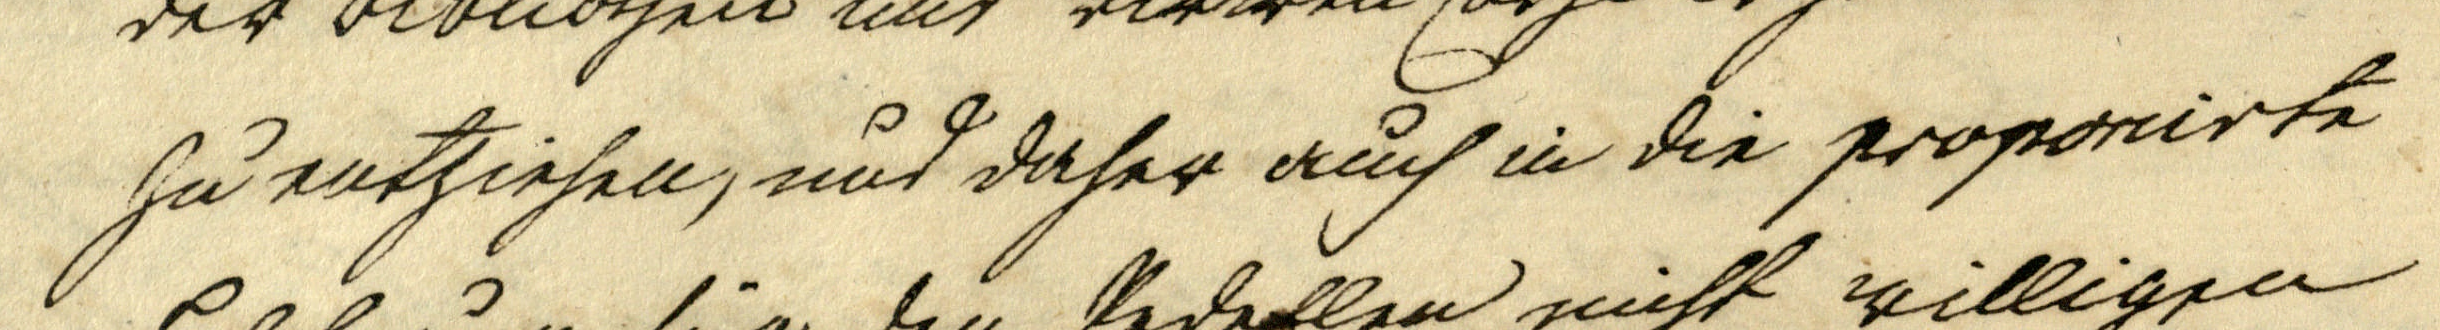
zu entziehen, und daher auch in die proponirte
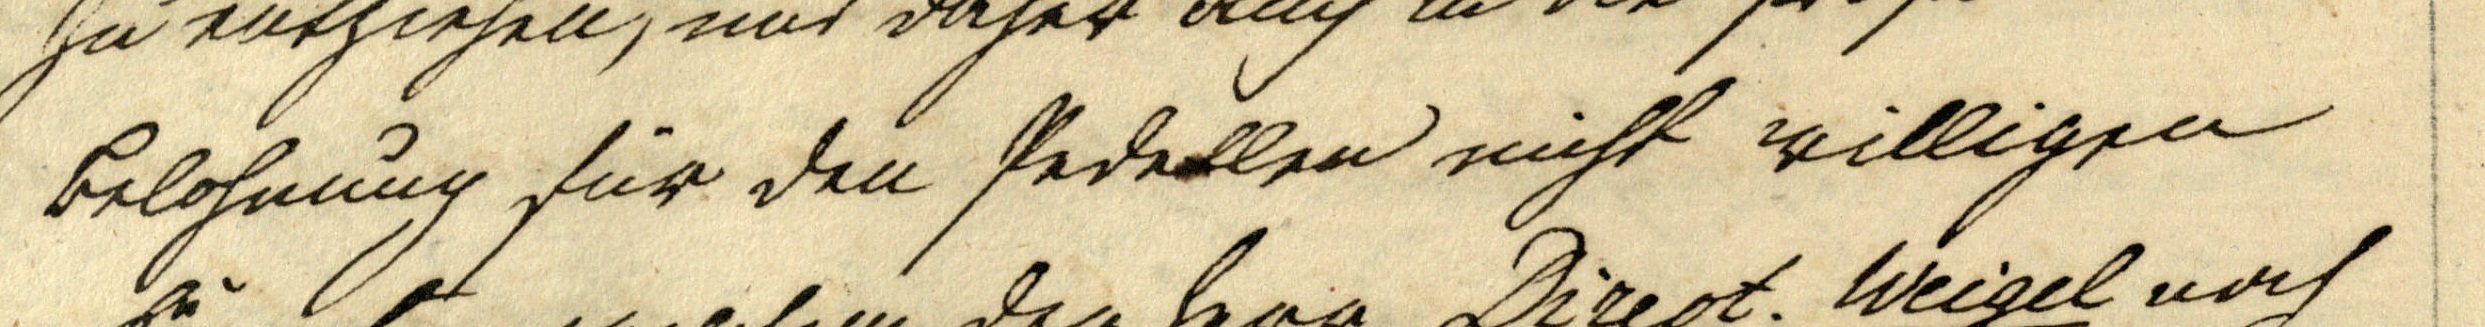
Belohnung für den Pedellen nicht willigen
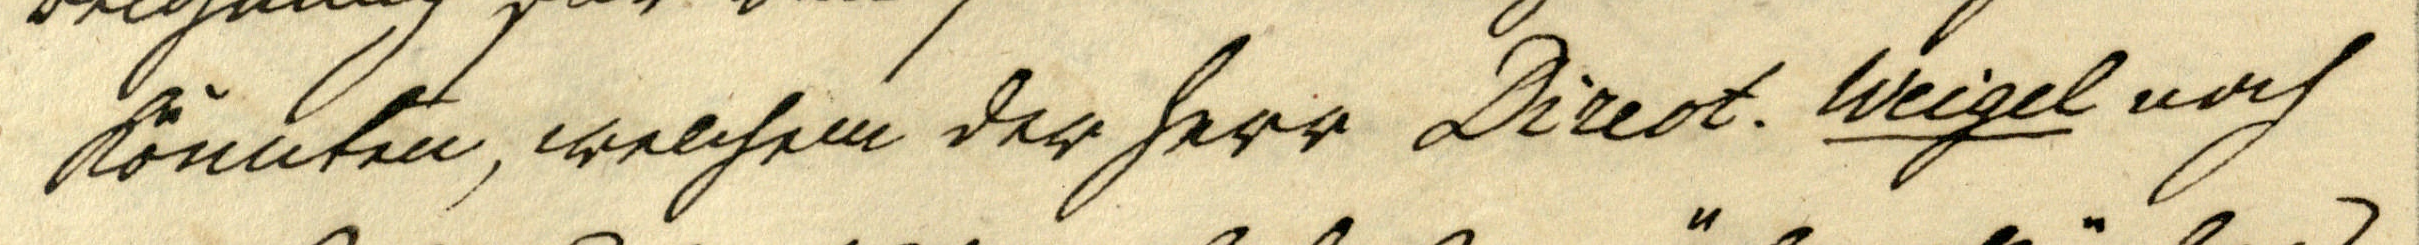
könnten, welchem der Herr Direct. Weigel noch
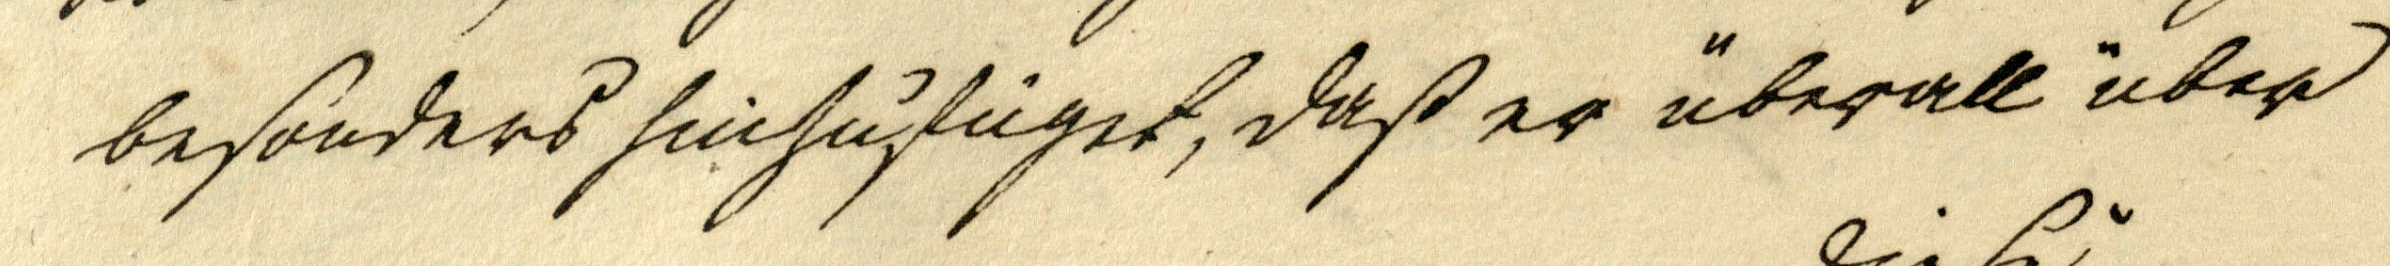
besonders hinzufüget, daß er überall über
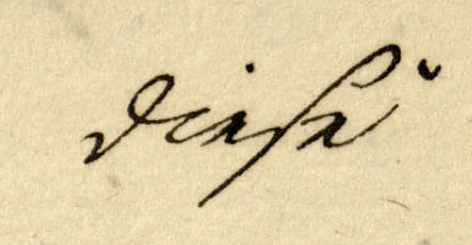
diese
